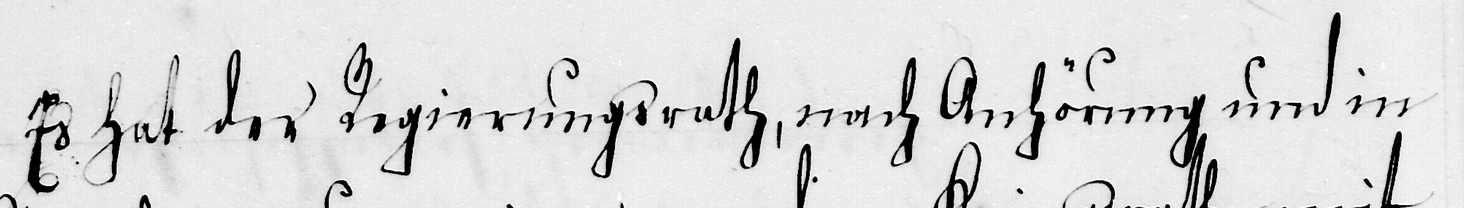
Es hat der Regierungsrath, nach Anhörung und in
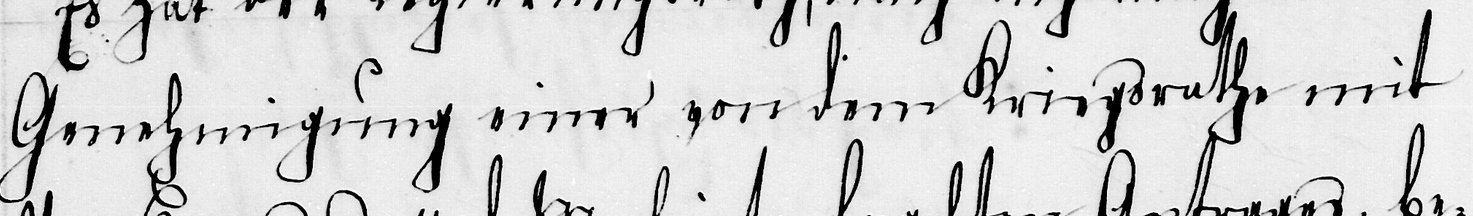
Genehmigung einer von dem Kriegsrathe mit
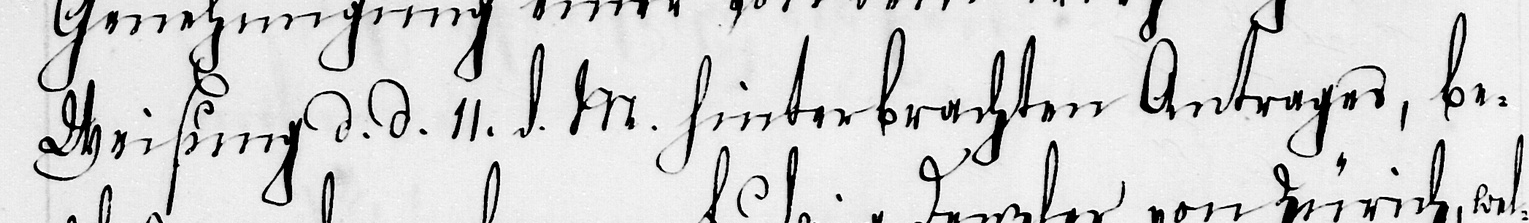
Weisung d. d. 11. d. M. hinterbrachten Antrages, be¬
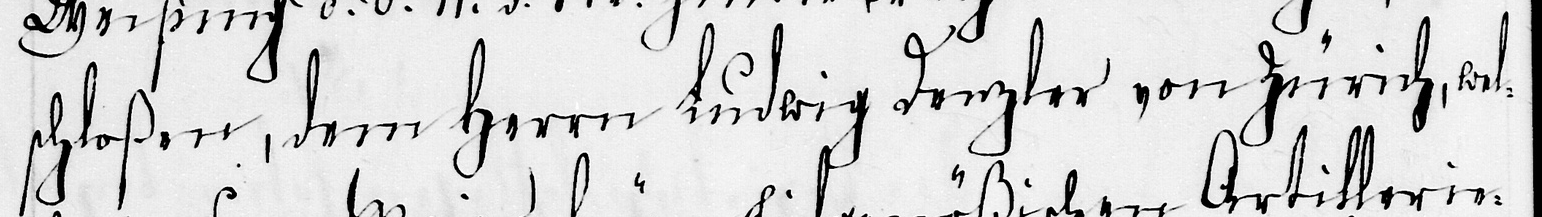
schloßen, dem Herrn Ludwig Denzler von Zürich, we¬
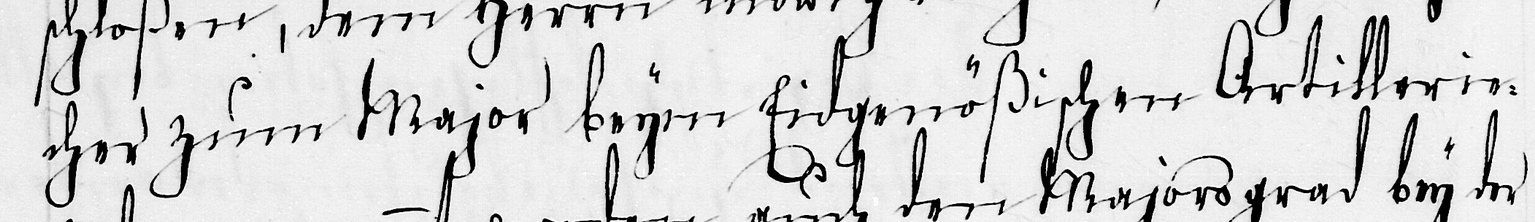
lcher zum Major beym Eidgenößischen Artillerie¬
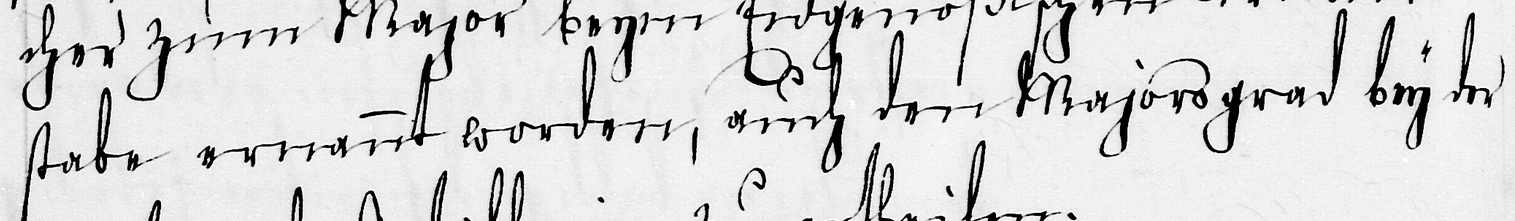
stabe ernannt worden, auch den Majorsgrad bey der
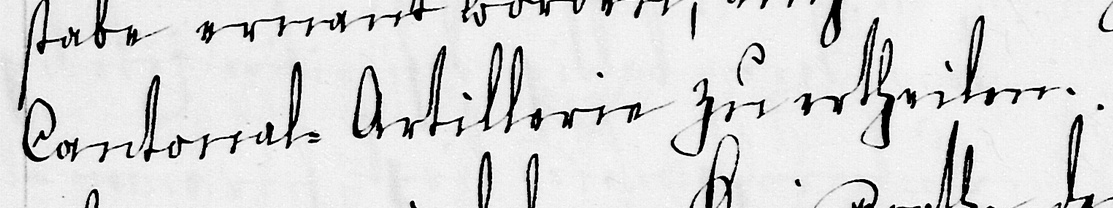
Cantonal-Artillerie zu ertheilen.
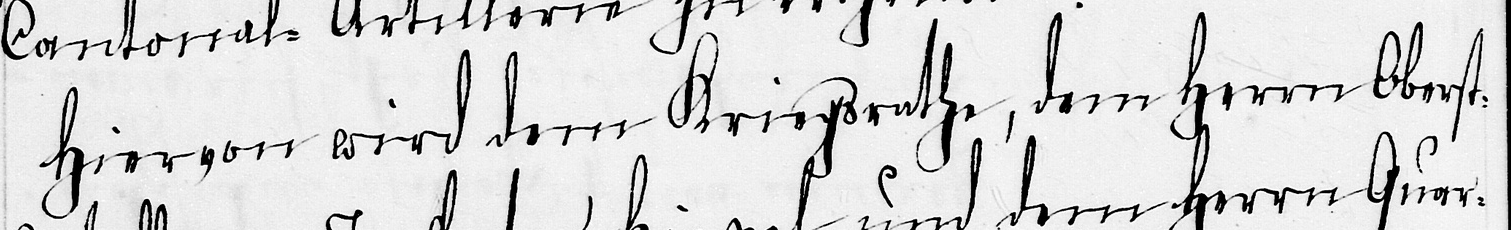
Hiervon wird dem Kriegsrathe, dem Herrn Obers¬
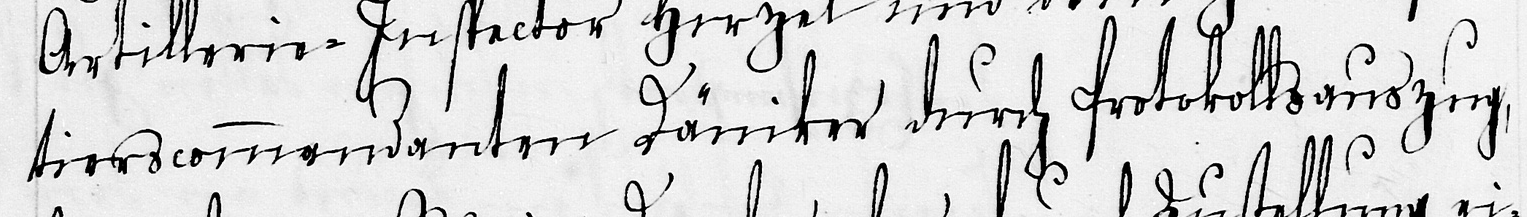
tierscommandanten Däniker durch Protokollsauszug,
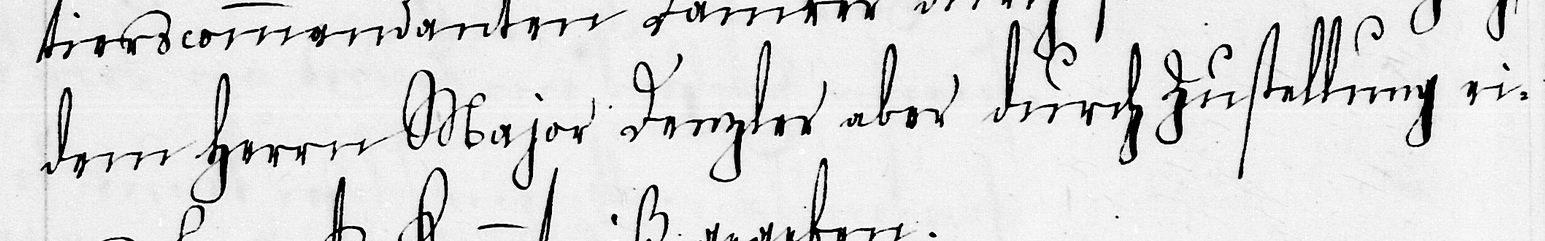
dem Herrn Major Denzler aber durch Zustellung ei¬
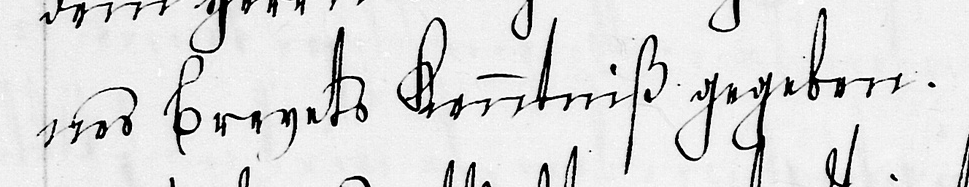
nes Brevets Kenntniß gegeben.
